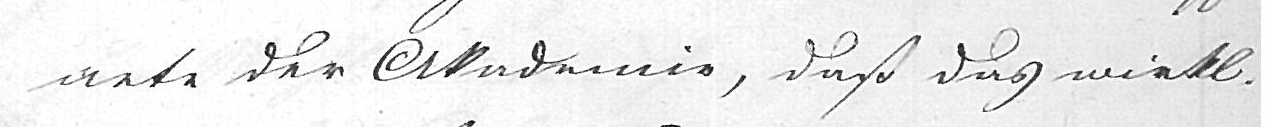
nete der Akademie, daß des wirkl.
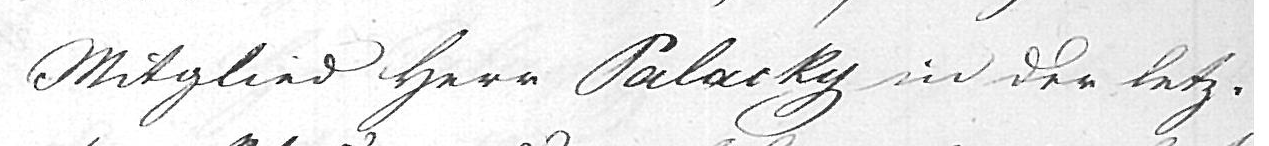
Mitglied Herr Palacky in der letz-
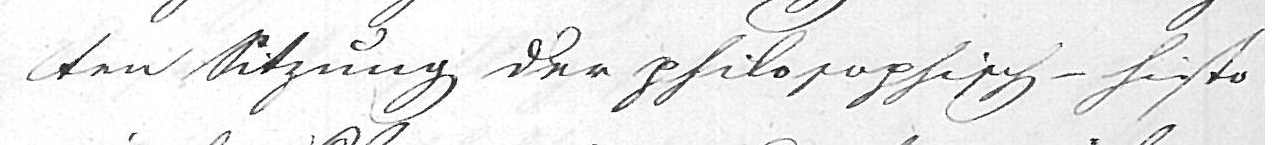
ten Sitzung der philosophisch-histo-
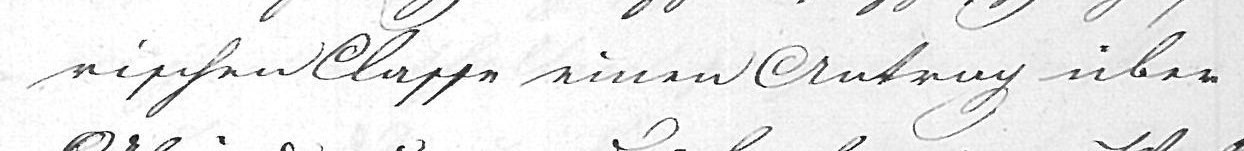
rischen Classe einen Antrag über
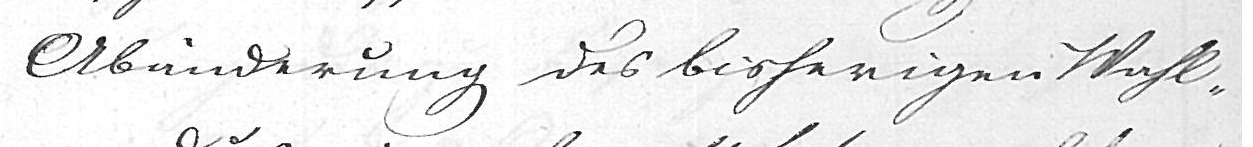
Abänderung des bisherigen Wahl-
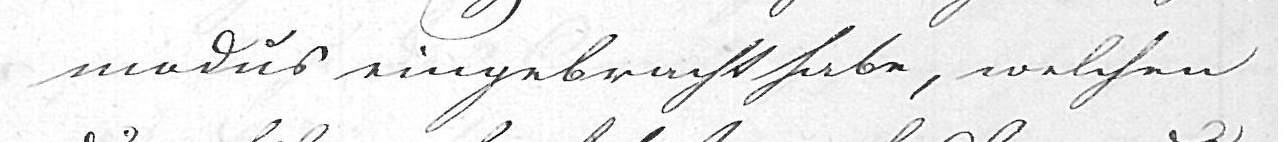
modus eingebracht habe, welchen
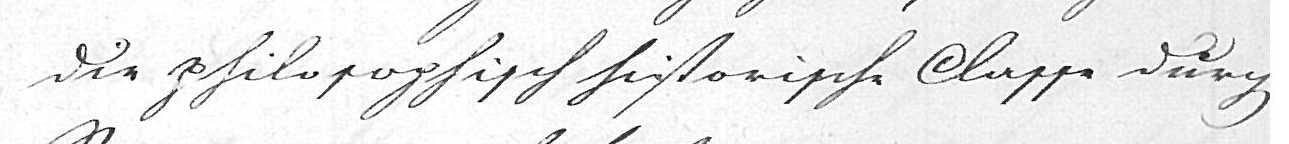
die philosophisch-historische Classe durch
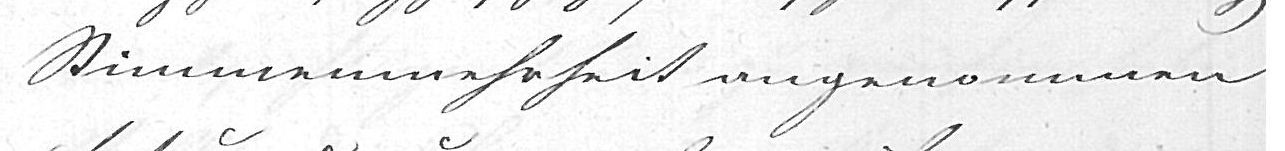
Stimmenmehrheit angenommen
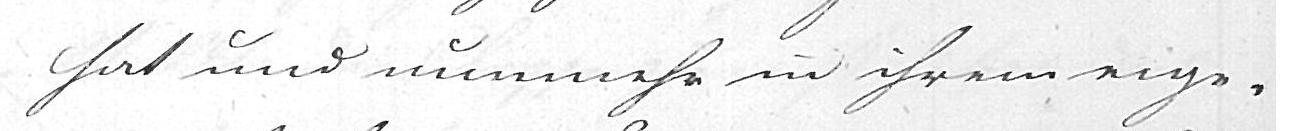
hat und nunmehr in ihrem eige-
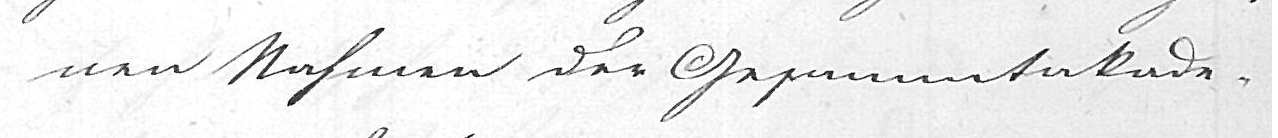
nen Nahmen der Gesammtakade-
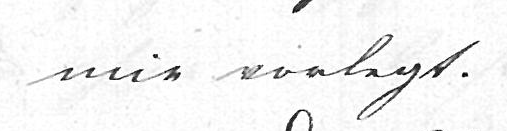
mie vorlegt.
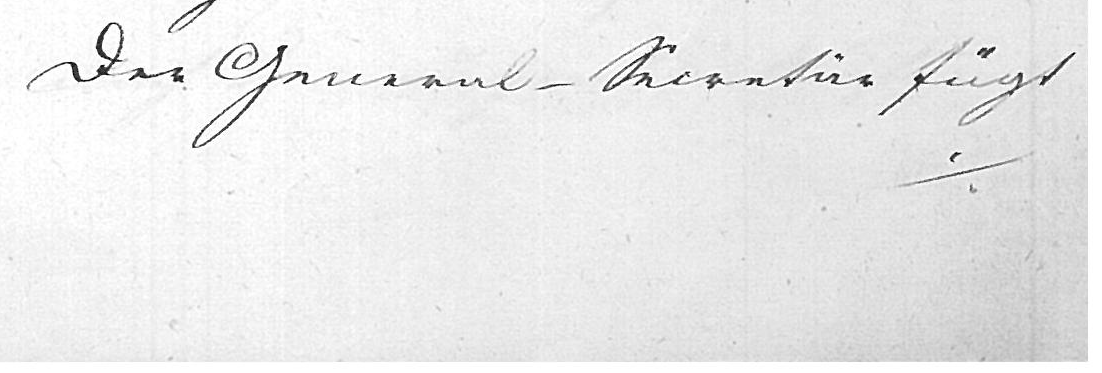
Der General-Secretär fügt
